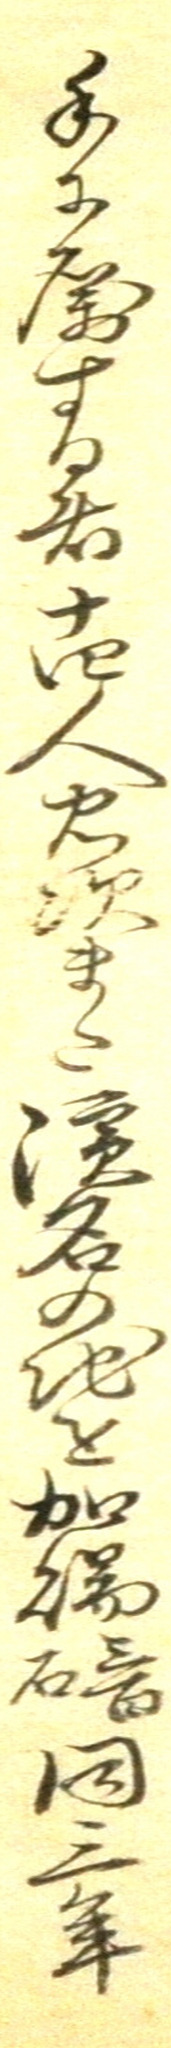手に属する者十余人忠次また浜名の地を加賜三百石同三年
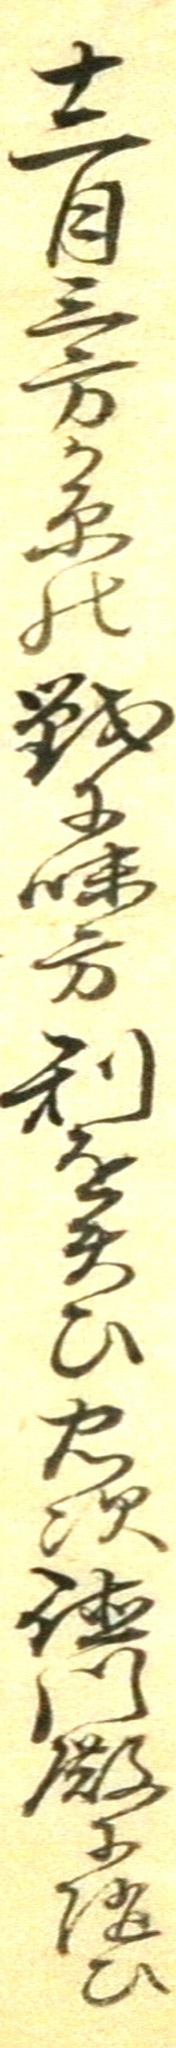十二月三方か原の戦に味方利を失ひ忠次徳川殿に随ひ
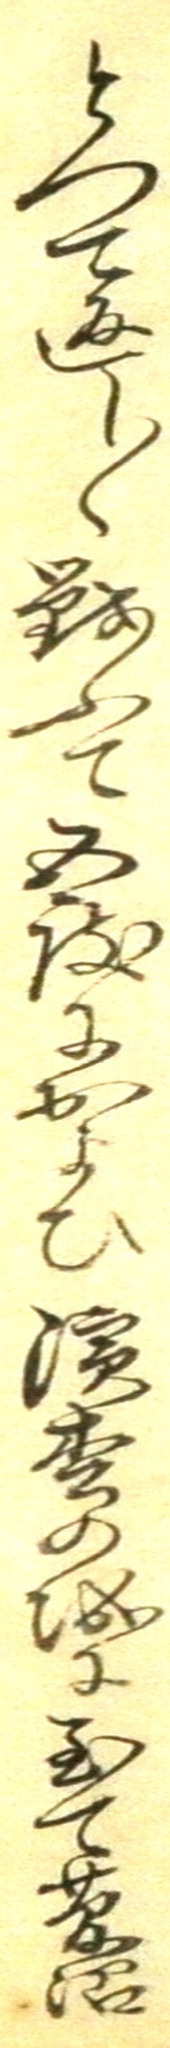とつて返し〳〵戦ふて五度におよひ浜松の城に至て菅沼
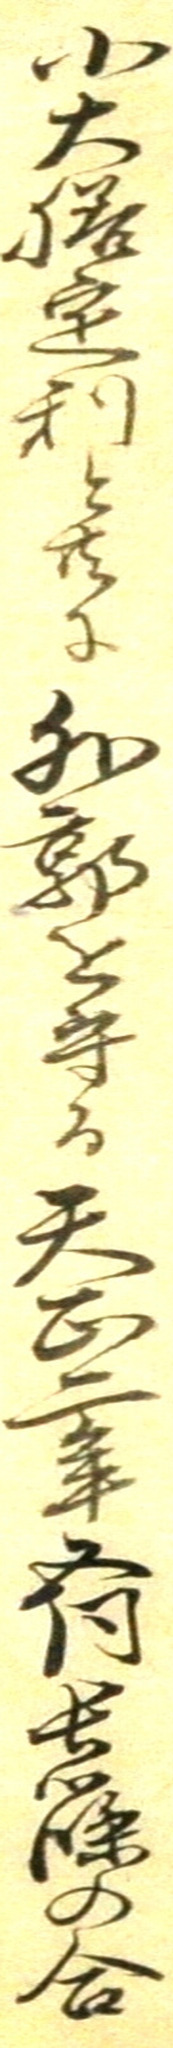小大膳定利と共に外郭を守る天正二年五月長篠の合
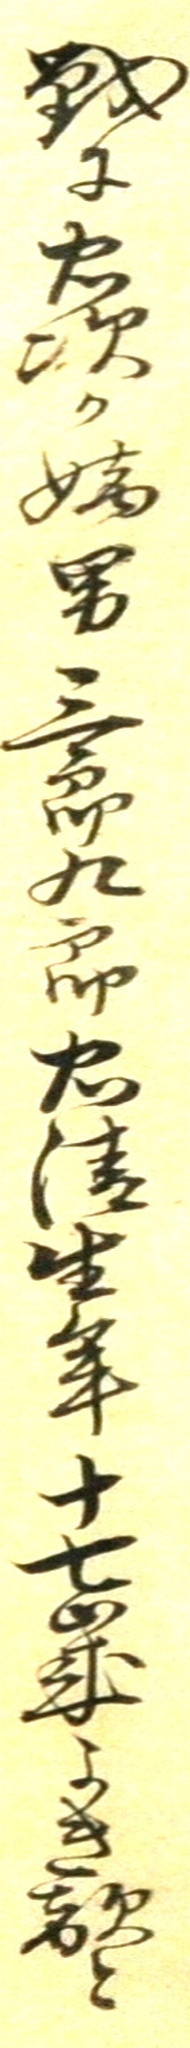戦に忠次か嫡男三郎九郎忠清生年十七歳よき敵と

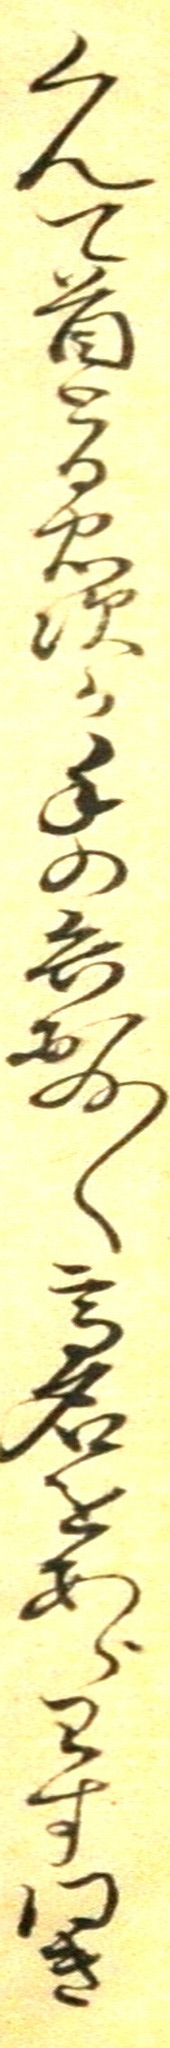くんて首とる忠次か手の兵おの〳〵高名をあらわす同き
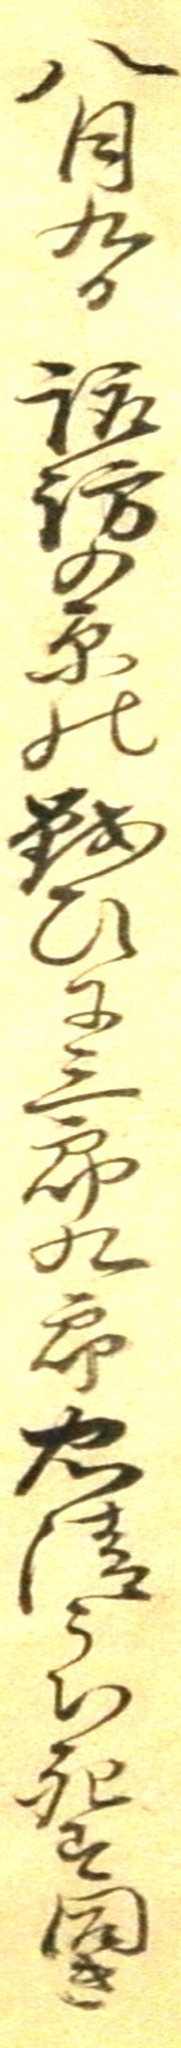八月九日諏訪の原の戦ひに三郎九郎忠清うち死す同き
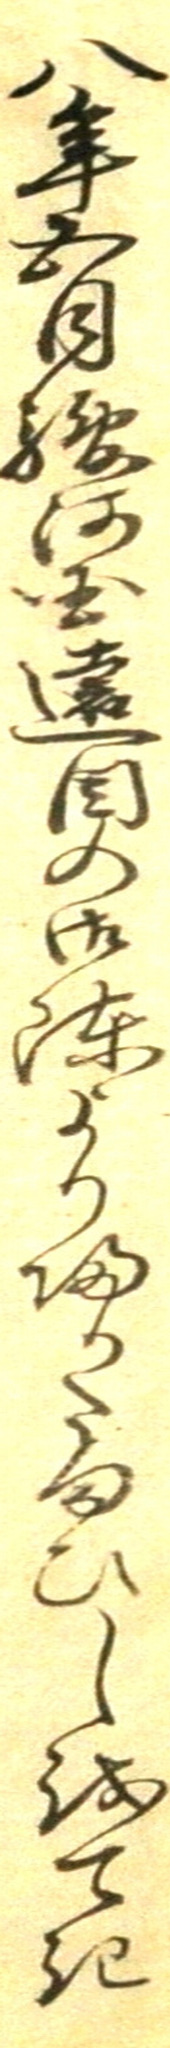八年五月駿河国遠目の御陣より帰りたまひしをてき
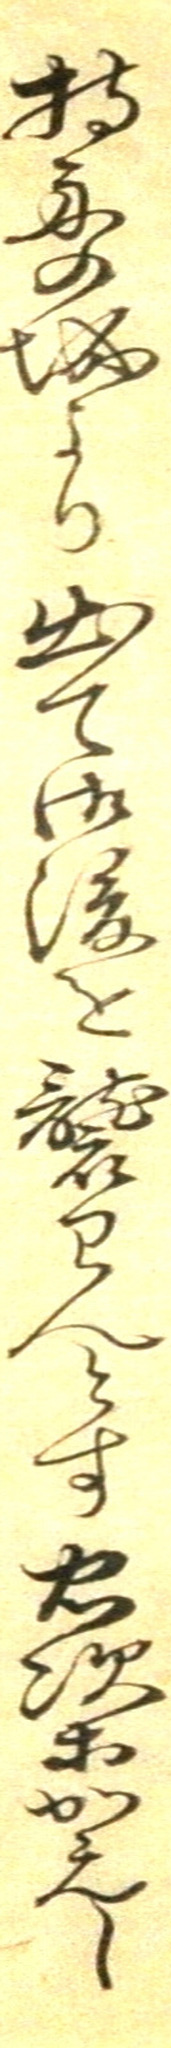持舟の城より出て御後を襲わんとす忠次等かえし
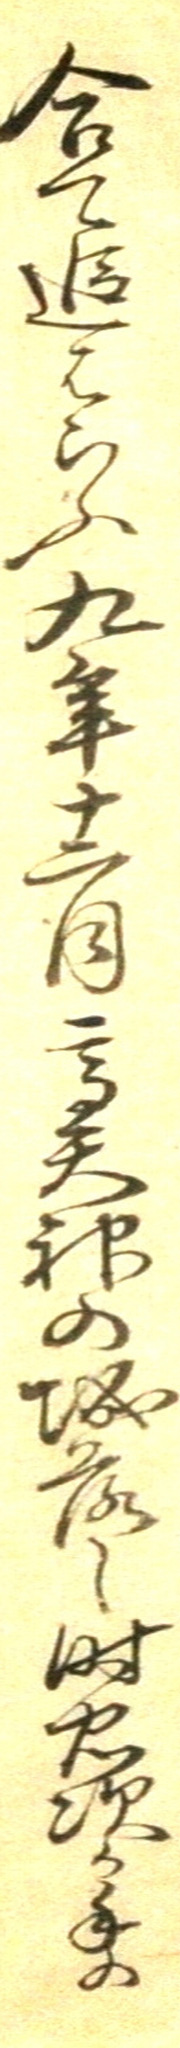合て追はらふ九年十二月高天神の城落し時忠次か手の
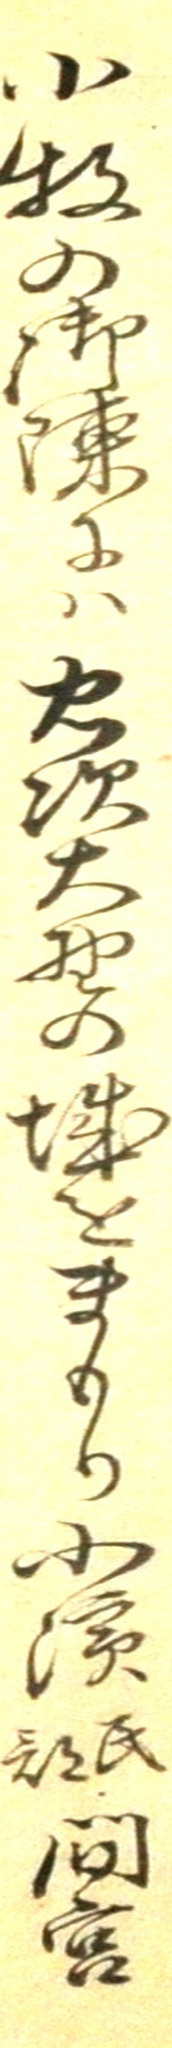小牧の御陣には忠次大野の城をまもり小浜民部間宮
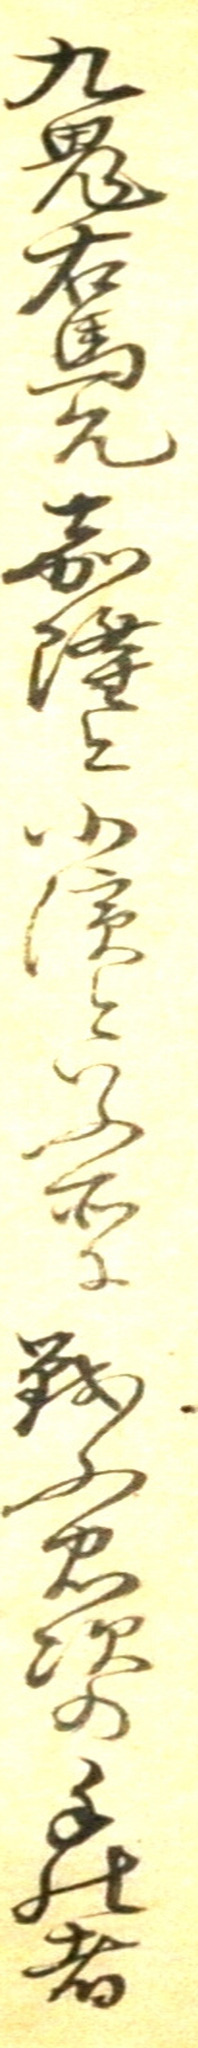九鬼右馬允嘉隆と小浜といふ所に戦ふ忠次の手の者
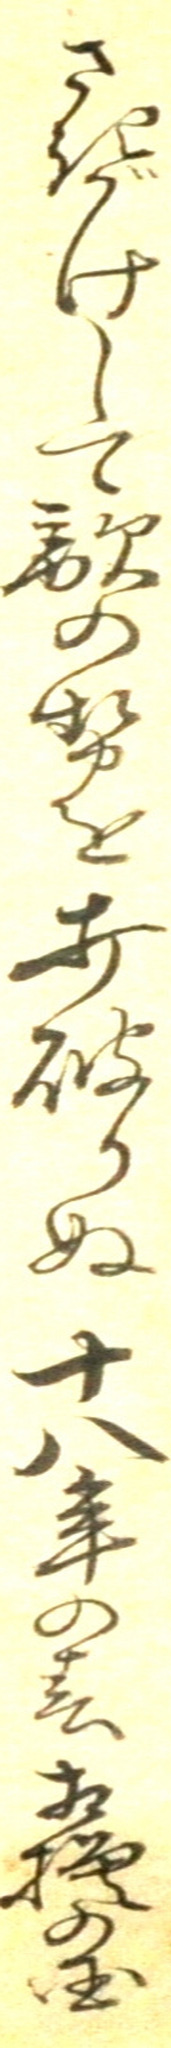さきがけして敵の勢を打破りぬ十八年の春相模の国
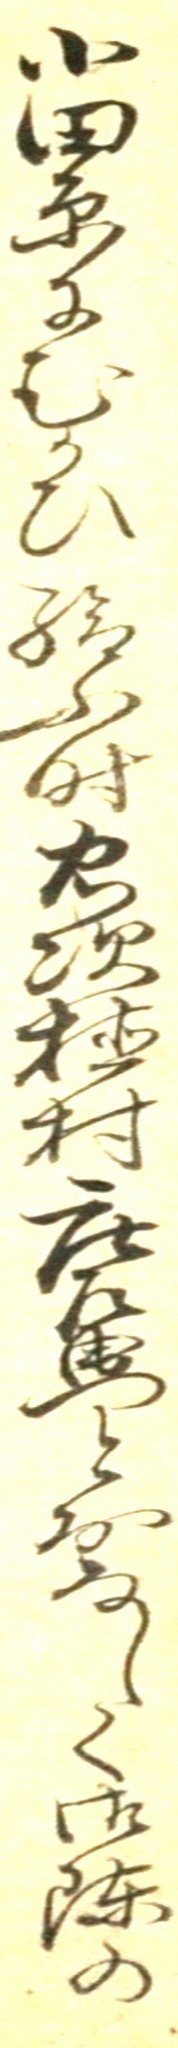小田原にむかひ給ふ時忠次植村庄左衛門とおなしく御陣の
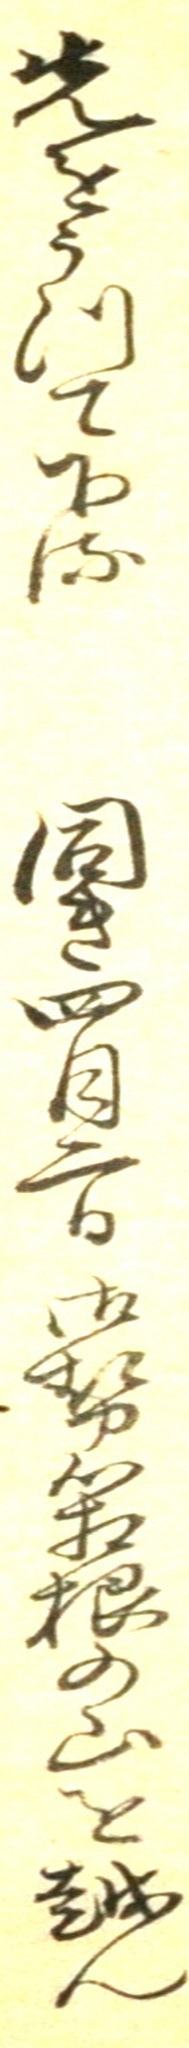先をうつて下る同き四月二日御勢箱根の山を越ん
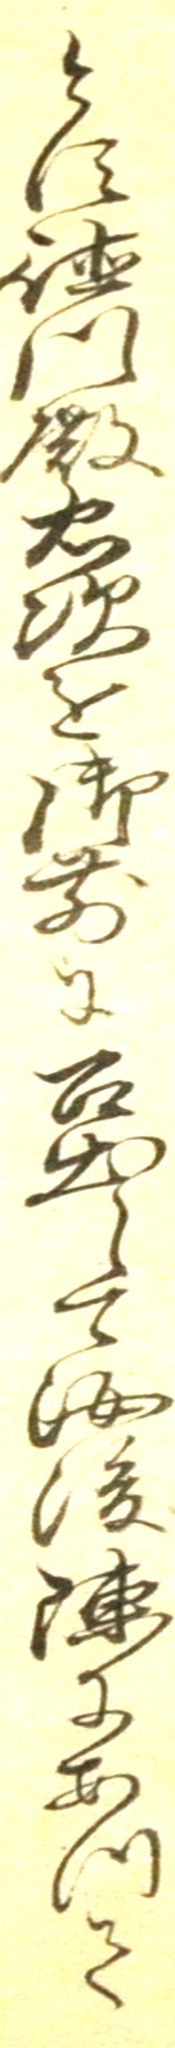とす徳川殿忠次を御前に召出して汝後陣にあつて
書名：藩翰譜（四・下）
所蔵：伊那市立高遠町図書館・合同会社AMANE
